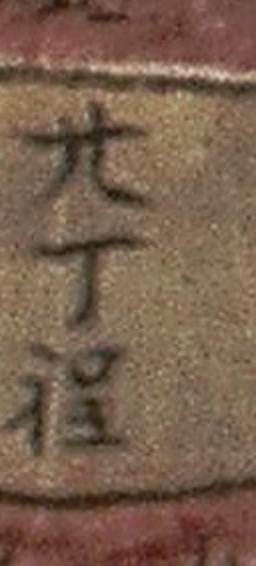廿丁程
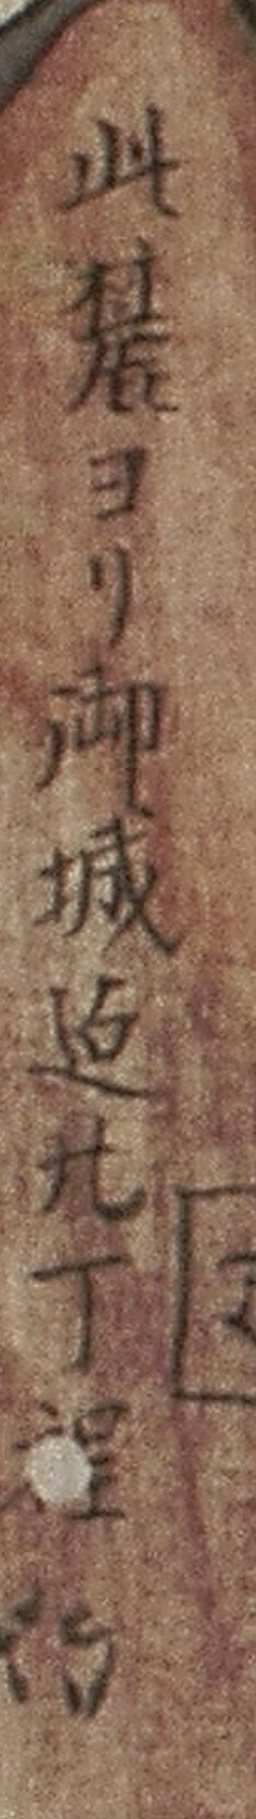此麓ヨリ御城迄廿丁程行
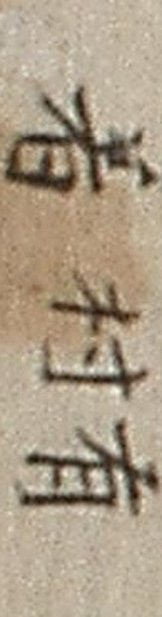小村有

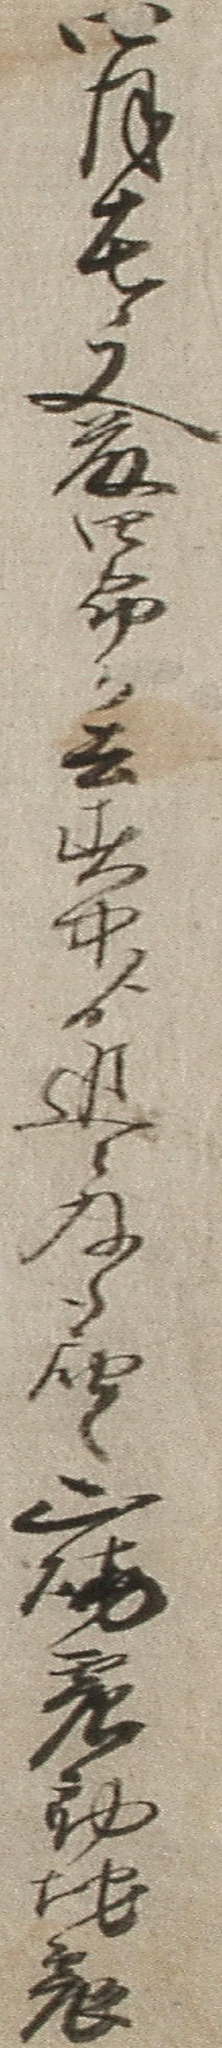四月十七日又藤四郎か去春中ゟ追々及御届候山焼震動地震
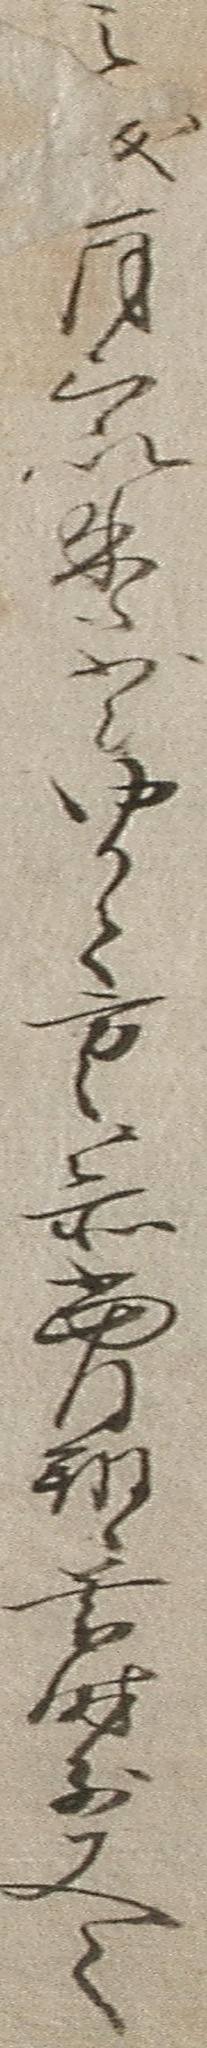之義一月三日以来少々ゆりて方々に候所当月朔日暮時前又々
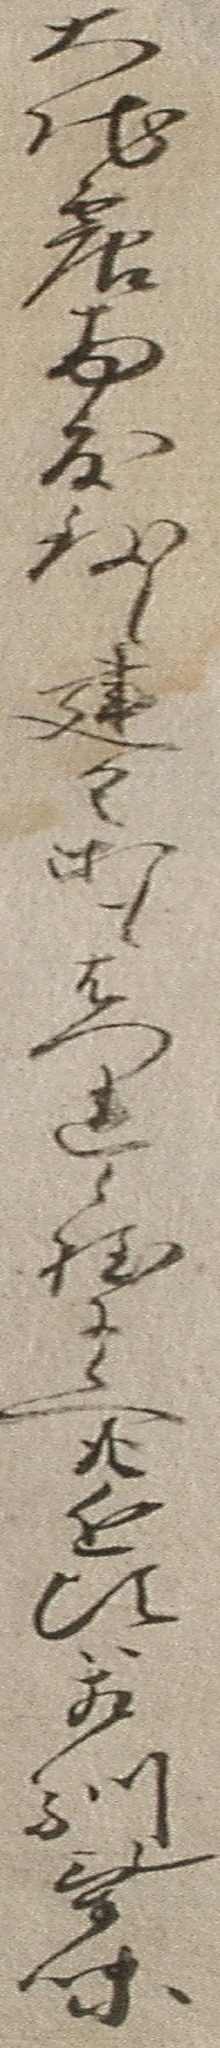大地震両度致し候建具等もはつれ候程に候へ共近頃は相馴レ気味
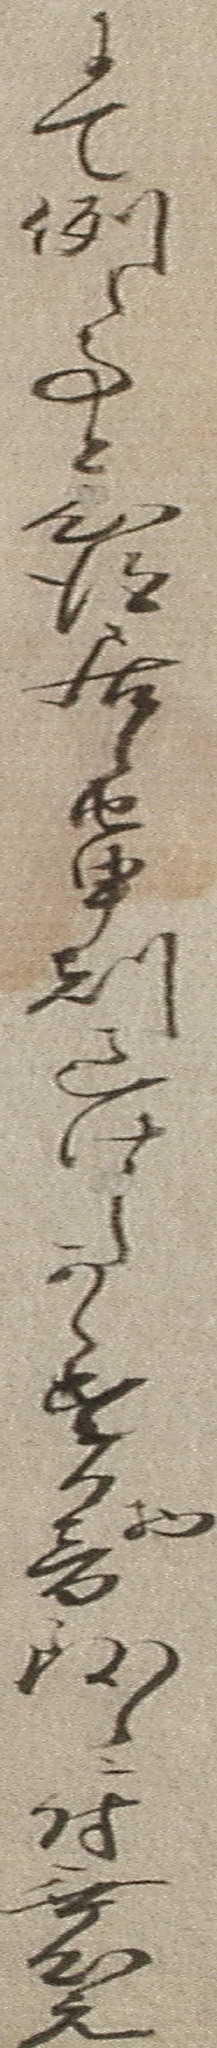にて例之事と心得居候由申刻迄けしからさる物音致候に付無心元
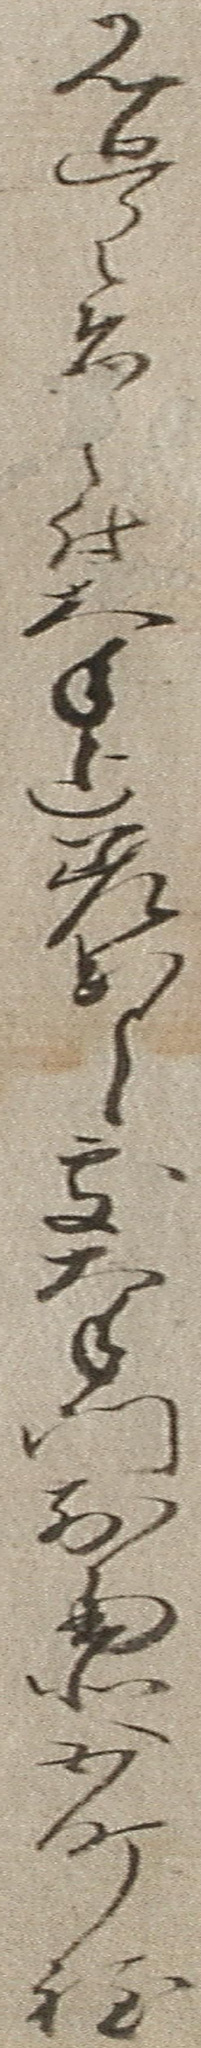見廻り候者に申付大手迄差出申候処大手門前南北へ五町程
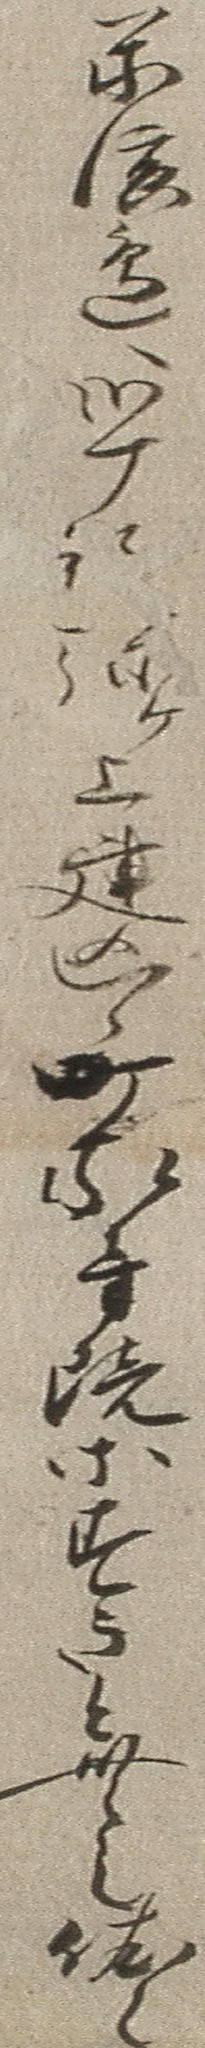東浜辺へ弐丁程弥ヶ上建込候町家寺院等すきと無之候徒に
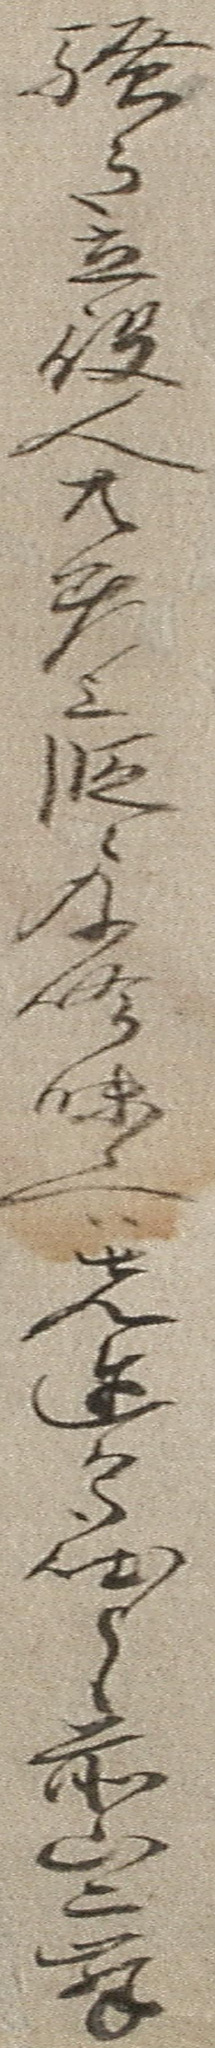騒き立役人共差上段々及吟味候へは先達而御届候前山二峯
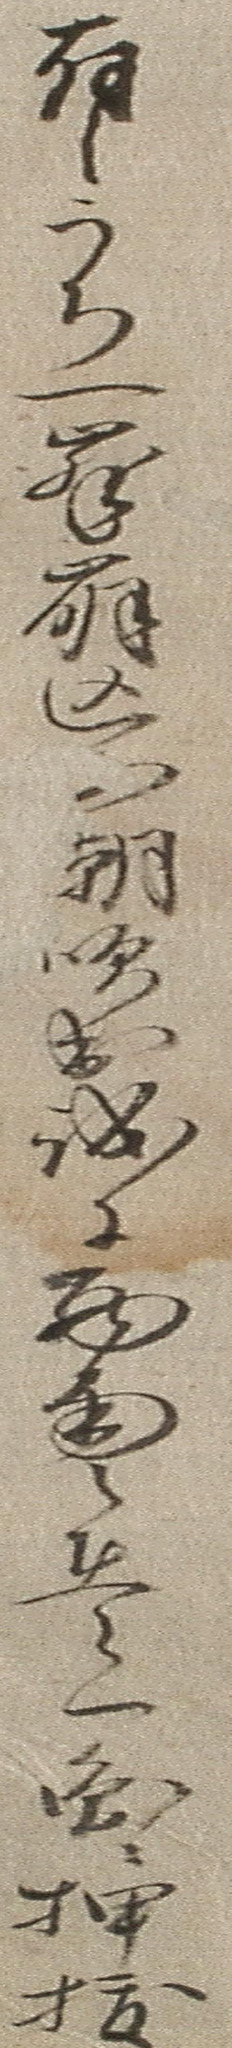有之うち一峯崩込潮吹出誠に西南之在々一円に押抜
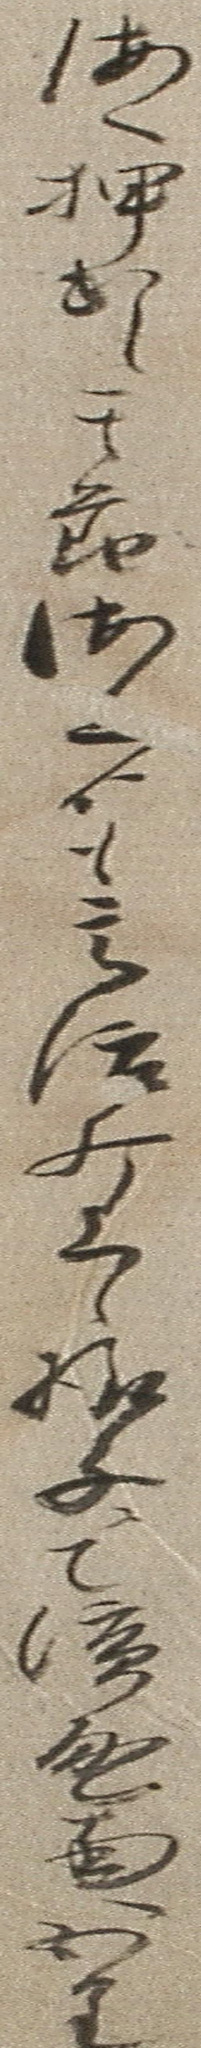海へ押出候其節海上ゟも高浪打上候様子にて浜通南へ五里
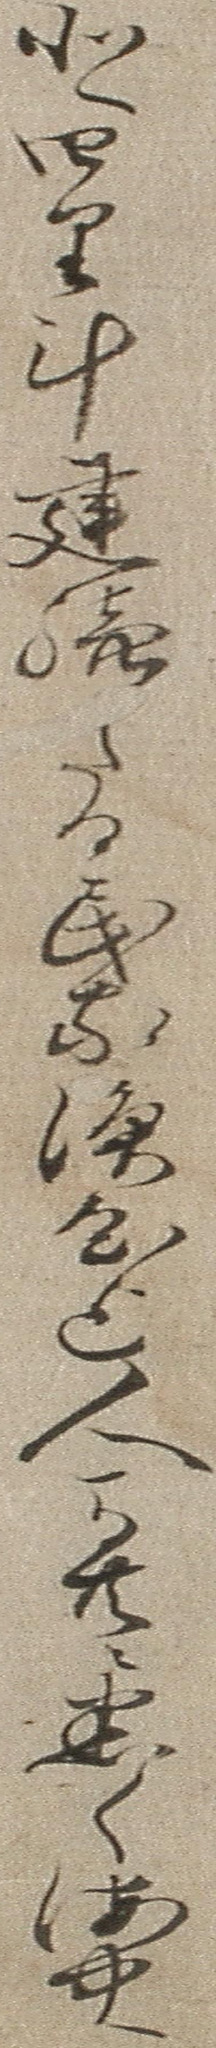北へ四里計建続たる民家漁屋迄人馬共に悉く海中へ
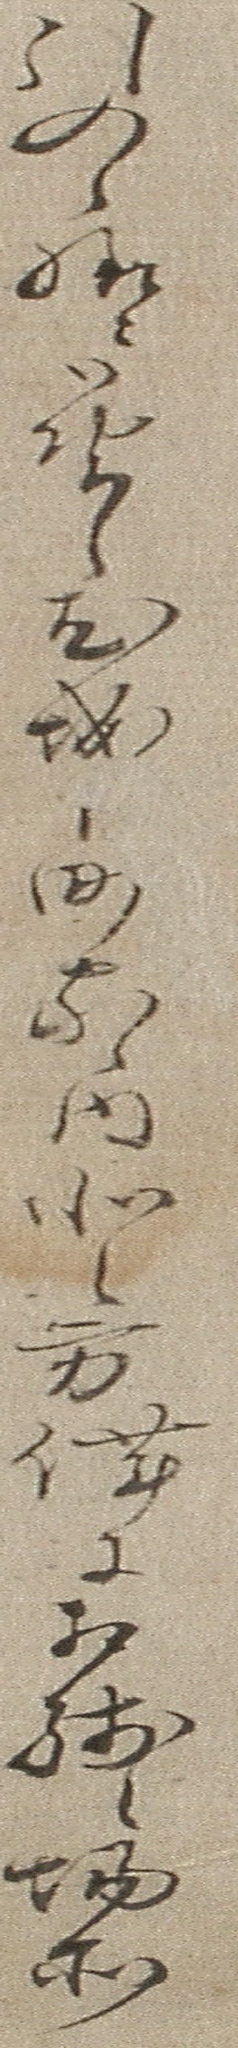引入候様に御座候尤城下町家内北之方僅に相残候場所
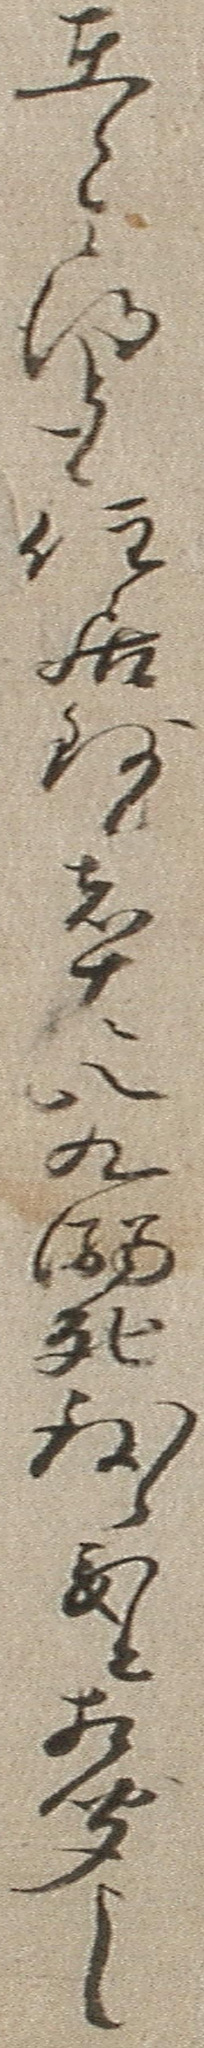在候得とも住居致候者十に八九溺死致し候義と相聞申候
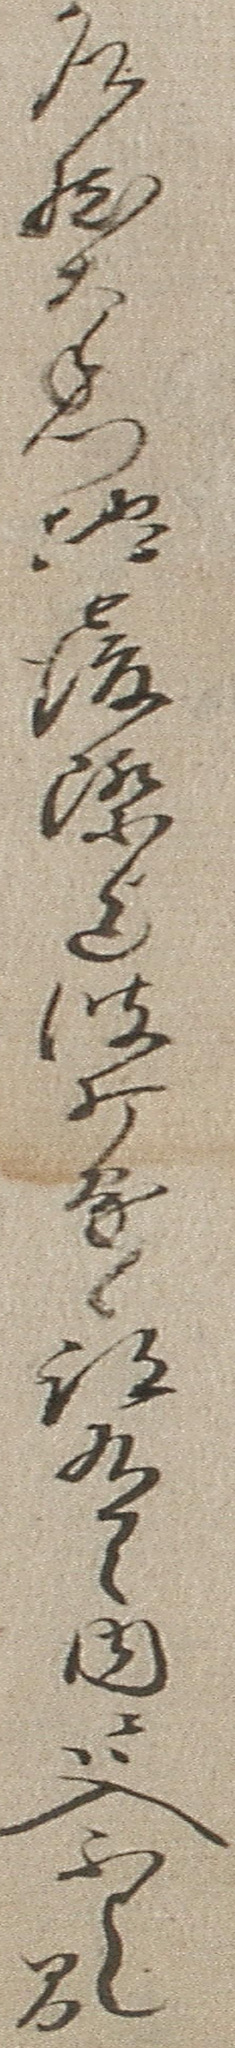乍然大手門地覆際迄波打懸候跡有之内には入不申候間
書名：太平秘録抜書　浅間山燒及普賢山崩
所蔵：東京大学地震研究所図書室 Earthquake Research Institute Library, The University of Tokyo, JAPAN
